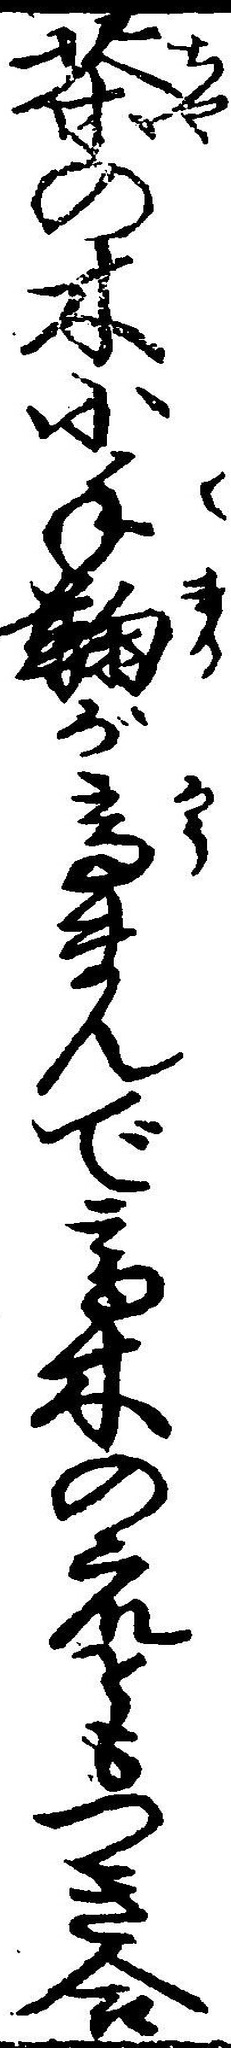茶の木に手鞠が高まんで高木の衆ともつき合
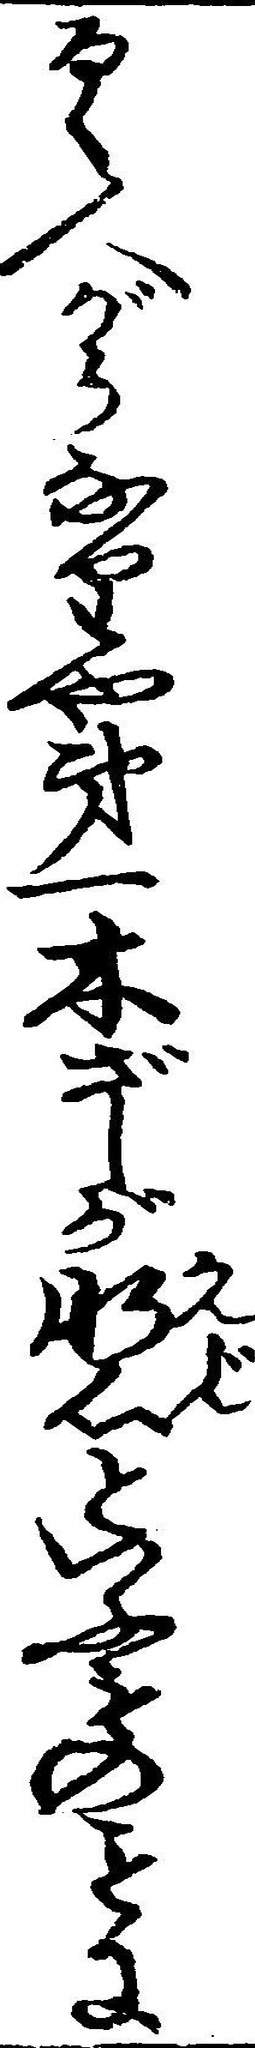るゝ人がらなりや第一木ざしが肝心といふものものことに
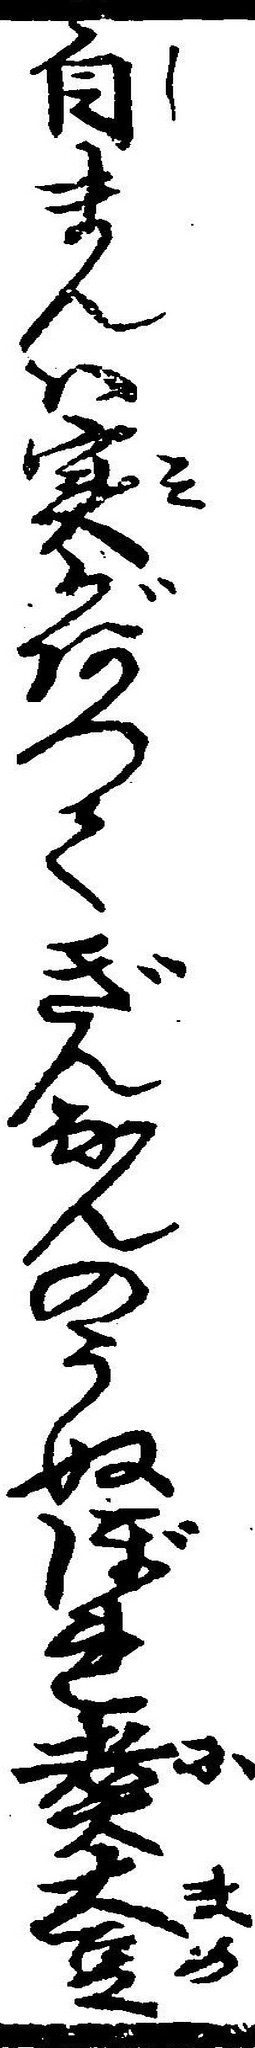自まんは実があつてぎんなんのうぬぼれ煮大豆
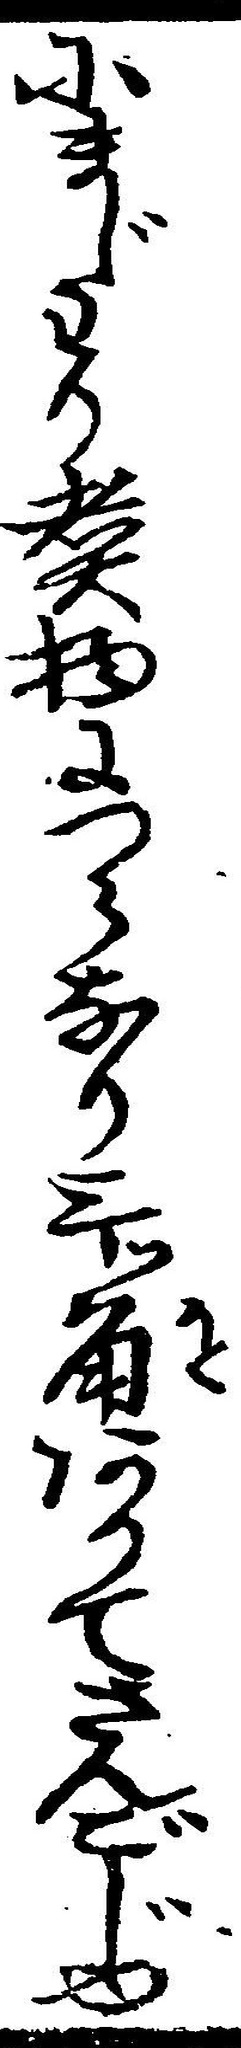にまじわり煮物につらなり三ッ角ありてさんごじゆ
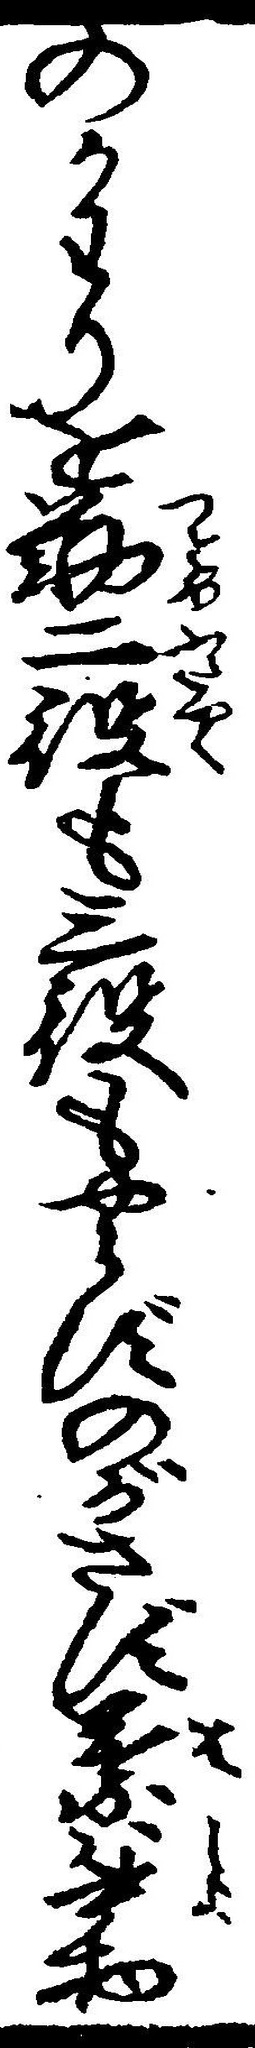のかわりを勤二役も三役もやらずのがさず葉は書物
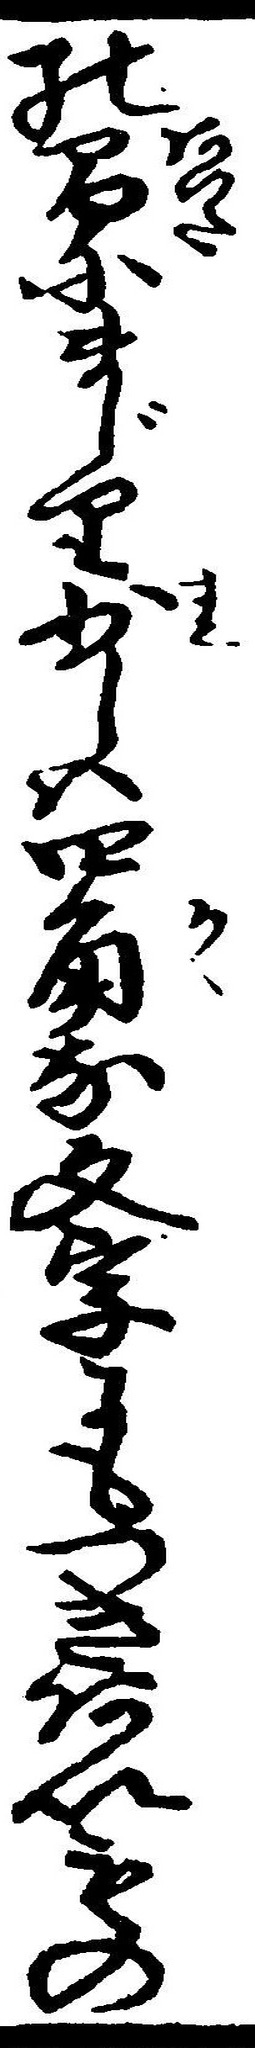の間にまじり少しは四角な文字にもつきあいもの
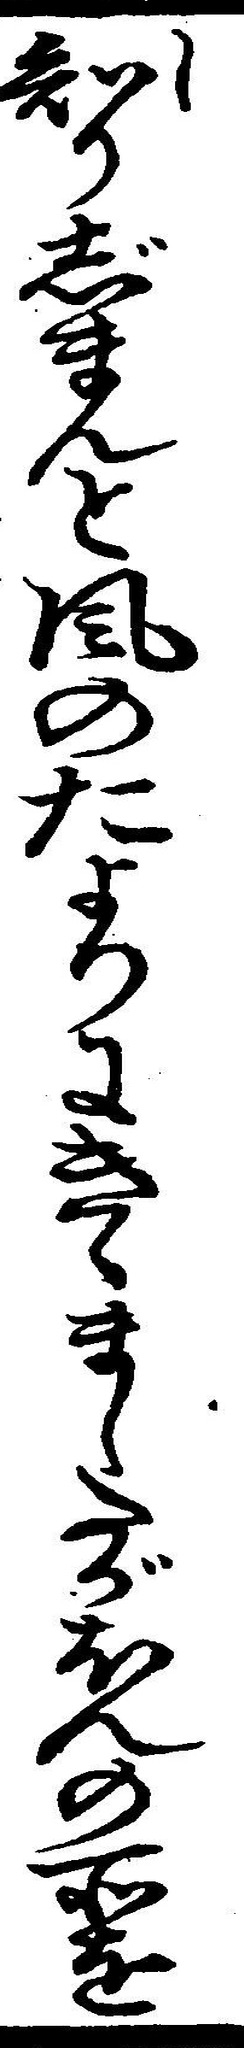知りじまんと風のたよりにきゝましたがほんの所を
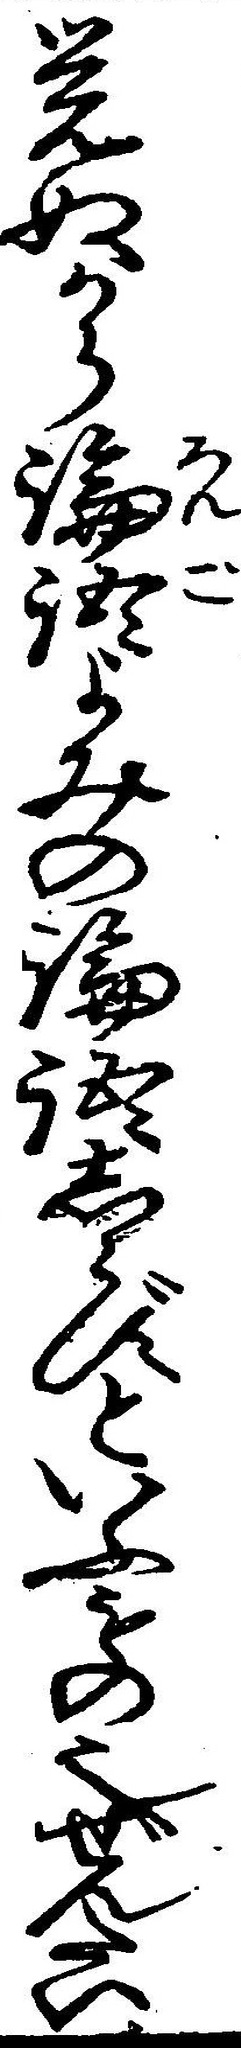覚ぬから論語よみの論語しらずといふもの也ぜんたい
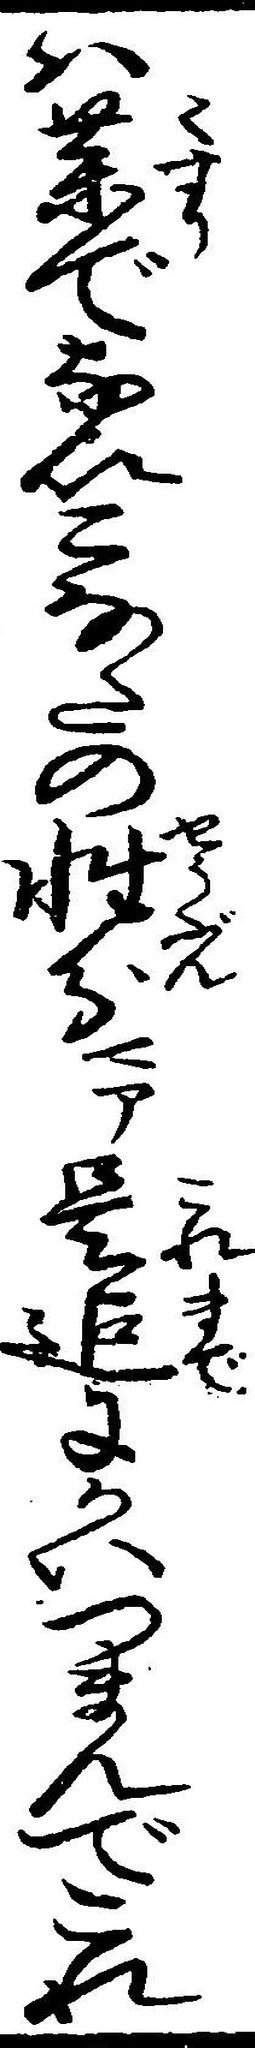は薬でないこなたの性分ニア是迄にかいつまんでこれ
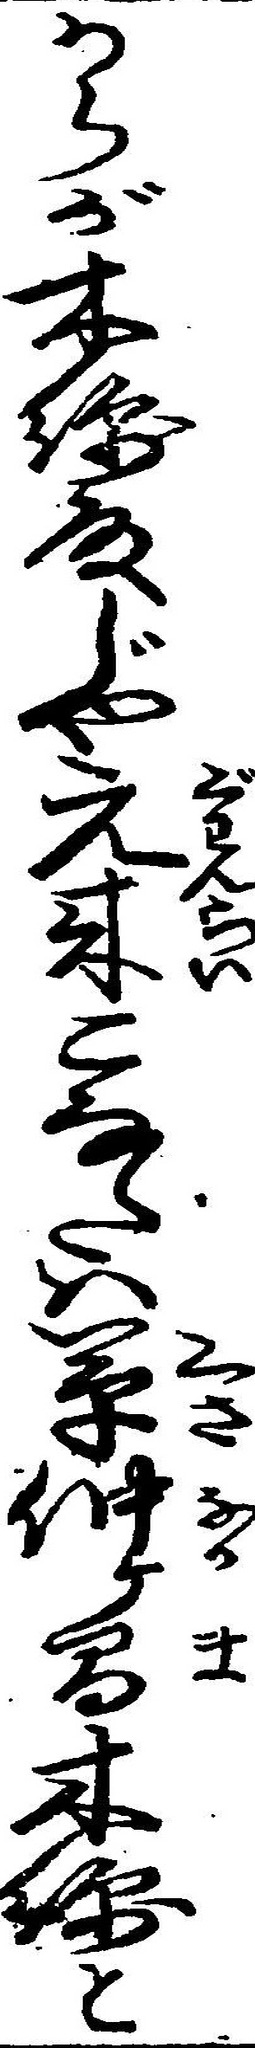からが木綿殿じや元来こなたは草仲ヶ間木綿と
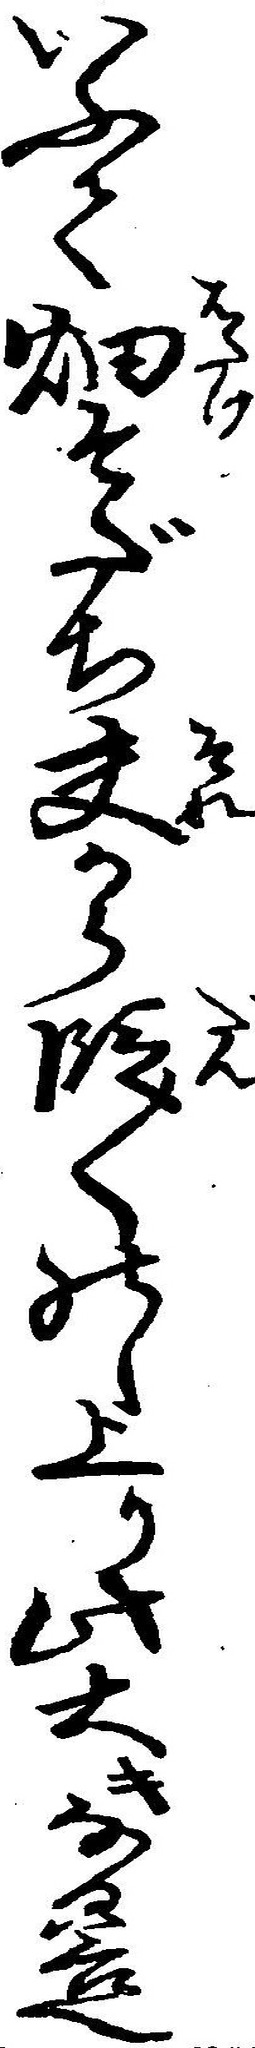いふて畑そだち夫から段〳〵のし上り此大谷へ
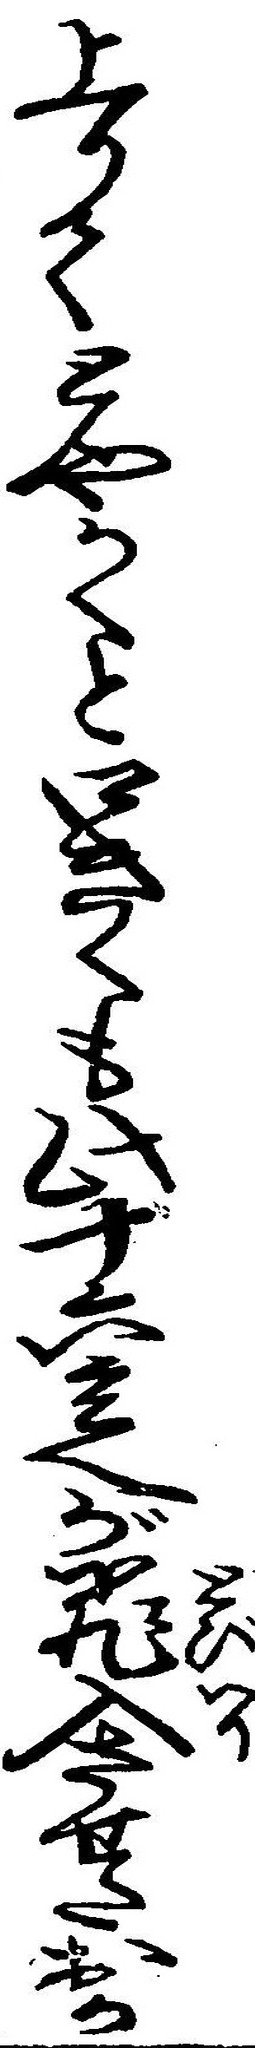上りてとやかくと口きくも此十六兵衛が飛入させたおか
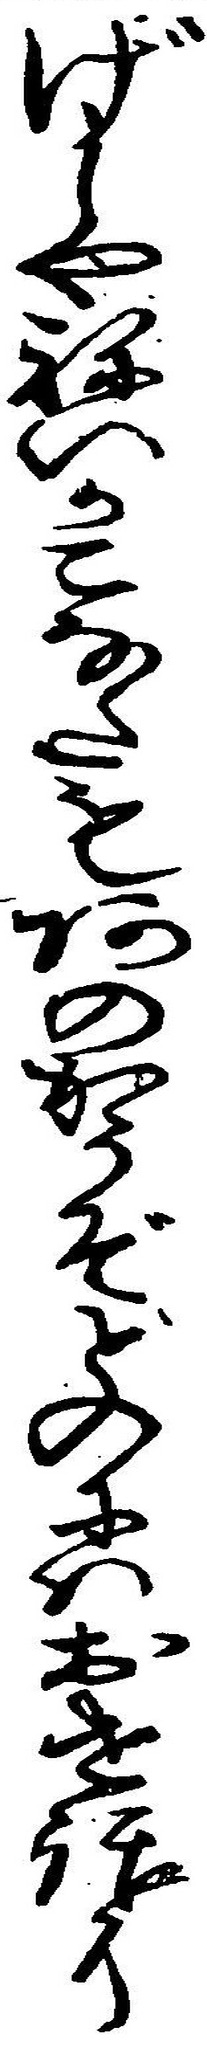げしやねいかこなたもあのかうぞとのにはお世話に

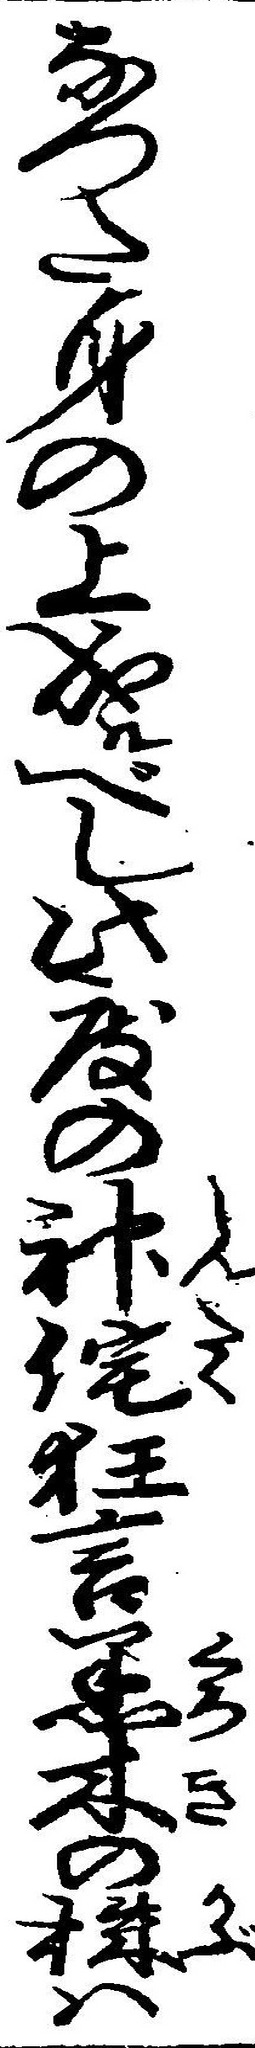なつた身の上成此度の神詫狂言黒木の株は
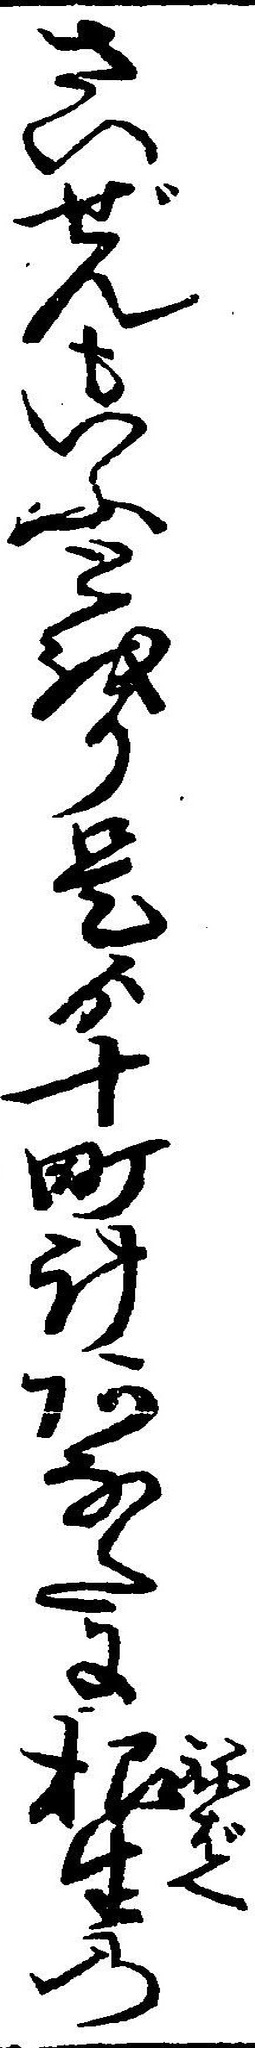さいぜんもいふとをり是ゟ十町計あなたの根生の
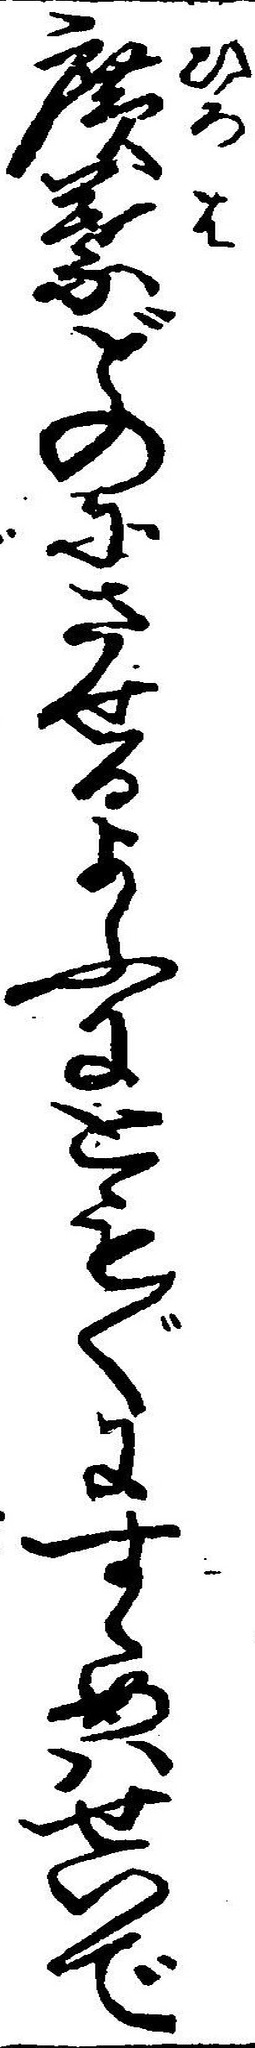広葉どのにさせるよふにとも〴〵にすゝめはせいで
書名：草木芝居化物退治 / 泉花堂三蝶(十六兵衛)作
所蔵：東京大学総合図書館 General Library in the University of Tokyo, JAPAN
